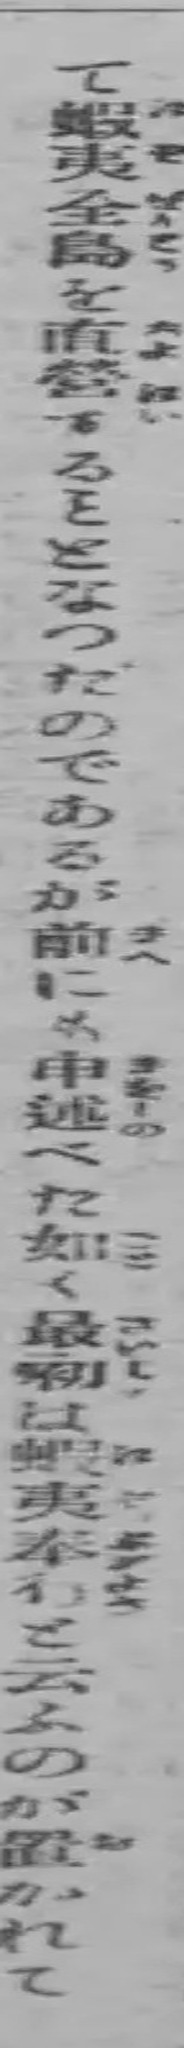松前奉行て蝦夷全島を直営することとなつたのであるが前にも申述べた如く最初は蝦夷奉行と云ふのが置かれて
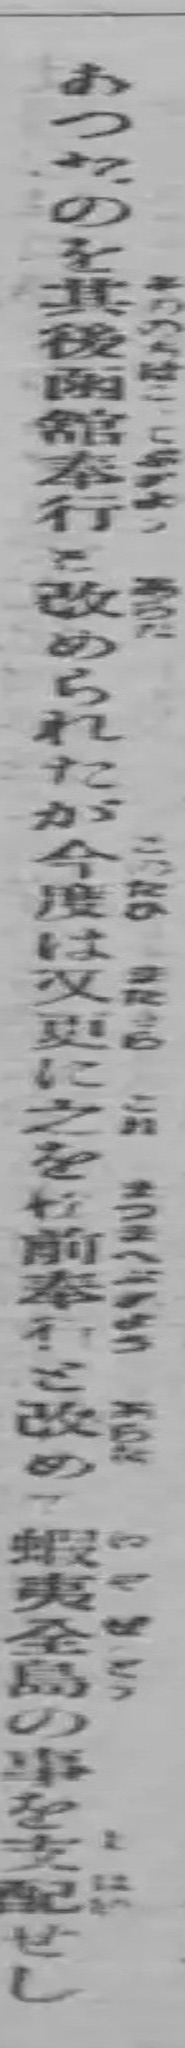あつたのを其後函館奉行と改められたが今度は又更に之を松前奉行と改めて蝦夷全島の事を支配せし
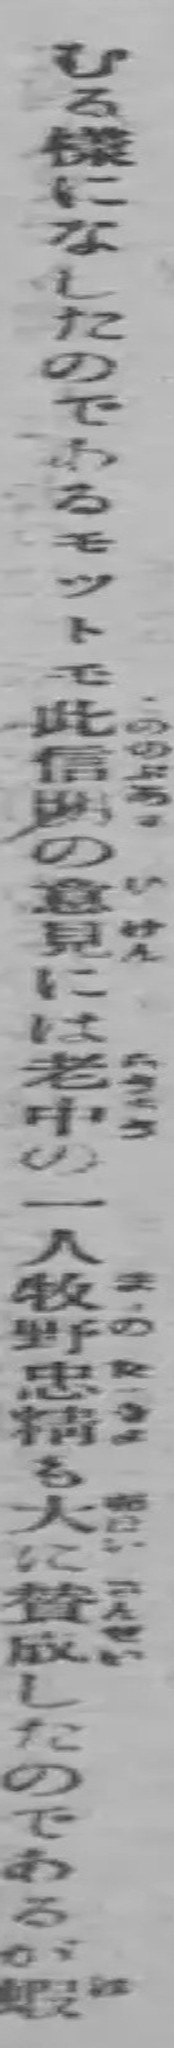むる様になしたのであるモツトモ此信明の意見には老中の一人牧野忠精も大に賛成したのであるが蝦
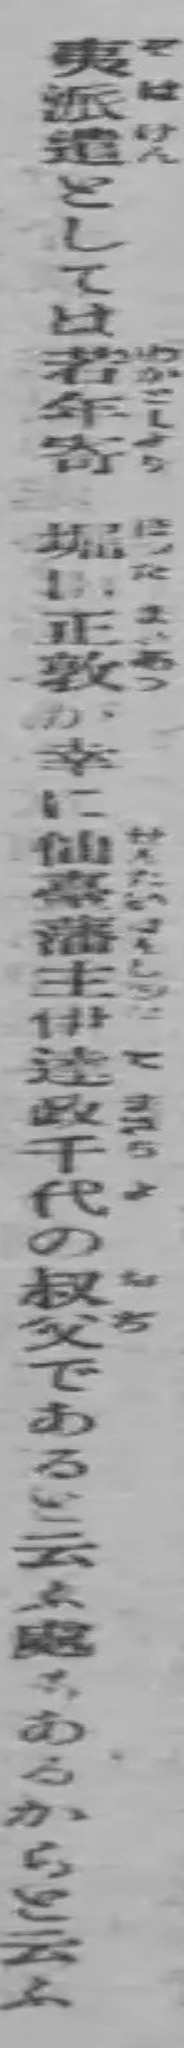夷派遣としては若年寄の堀田正敦が幸に仙台藩主伊達政千代の叔父であると云ふ処もあるからと云ふ

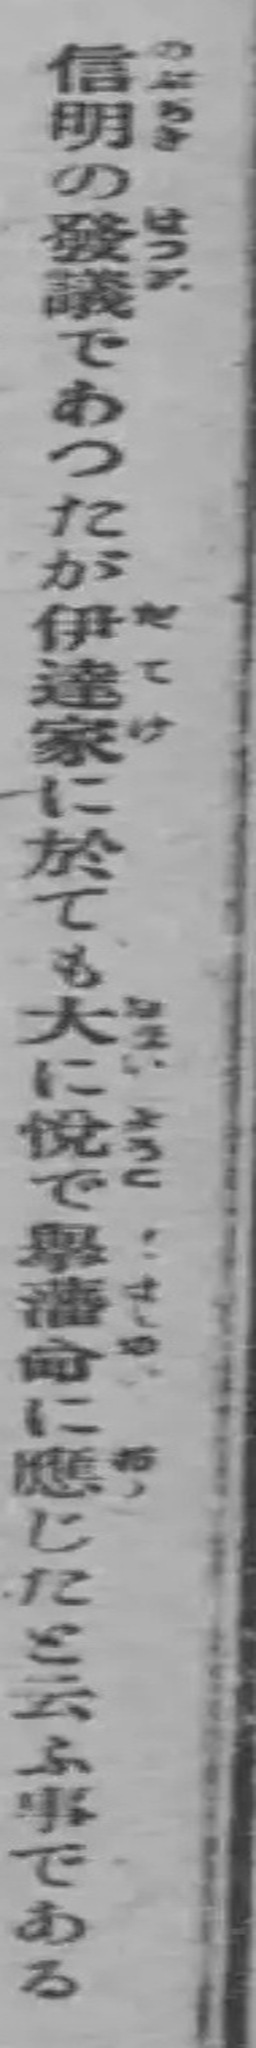信明の発議であつたが伊達家に於ても大に悦で挙藩命に応じたと云ふ事である
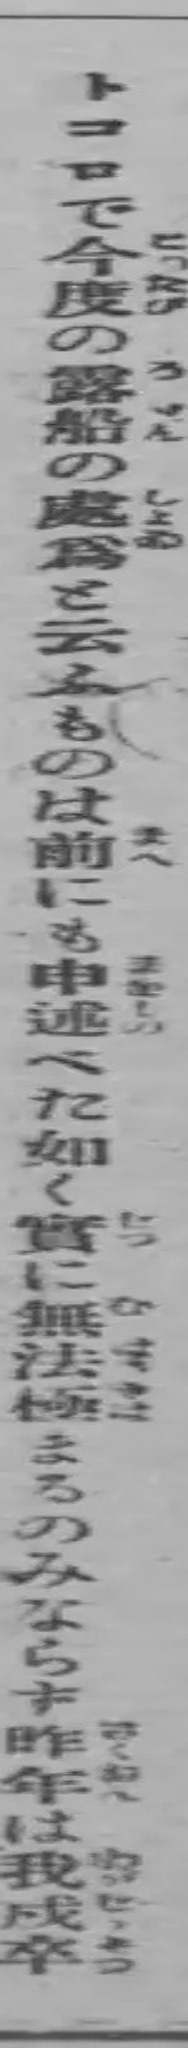トコロで今度の露船の処為と云ふものは前にも申述べた如く実に無法極まるのみならず昨年は我戌卒
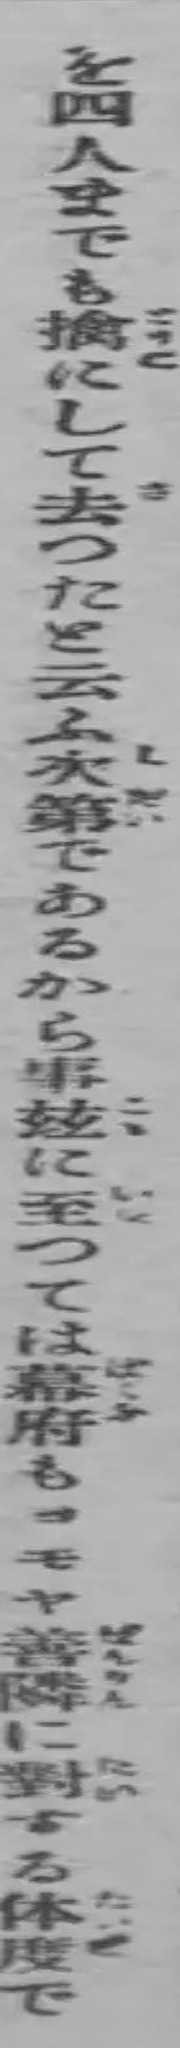を四人までも擒にして去つたと云ふ次第であるから事茲に至つては幕府もヨモヤ善隣に対する体度で
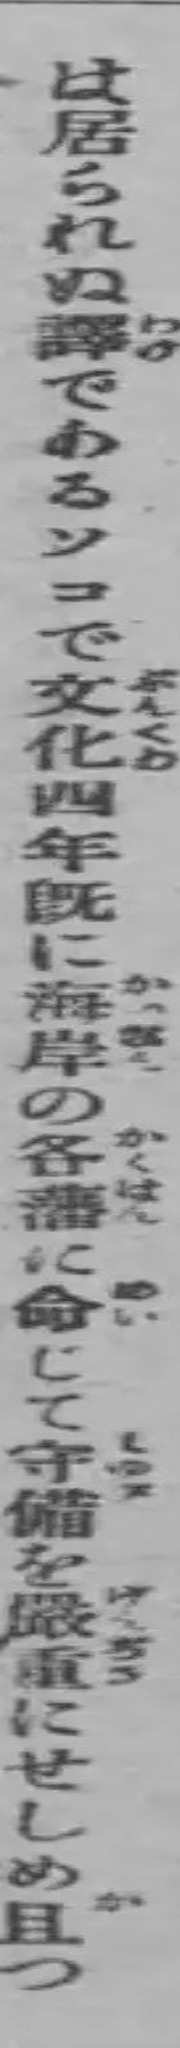は居られぬ訳であるソコで文化四年既に海岸の各藩に命じて守備を厳重にせしめ且つ
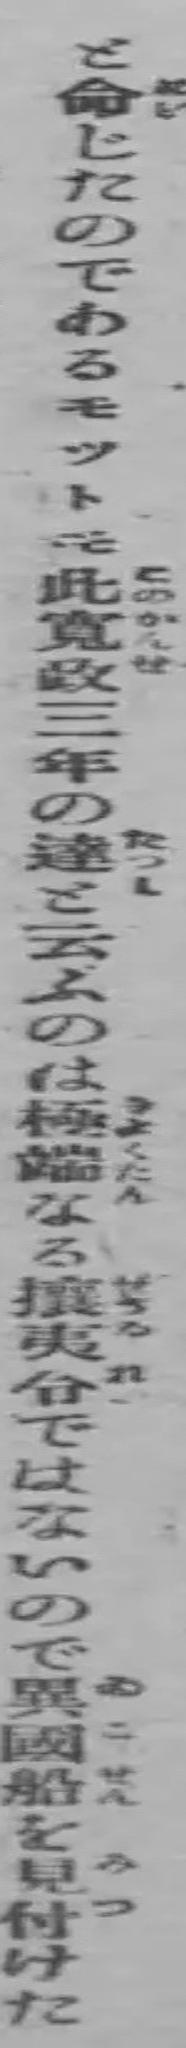と命じたのであるモツトモ此寛政三年の達と云ふのは極端なる攘夷令ではないので異国船を見付けた
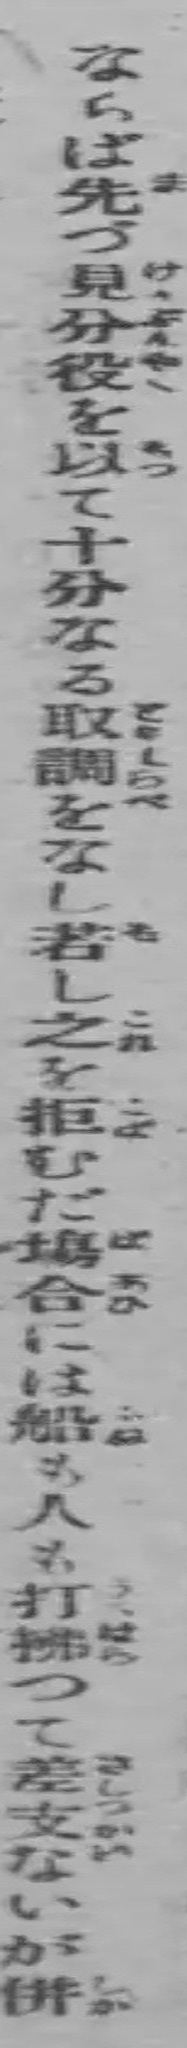ならば先づ見分役を以て十分なる取調をなし若し之を拒むだ場合には船も人も打払つて差支ないが併
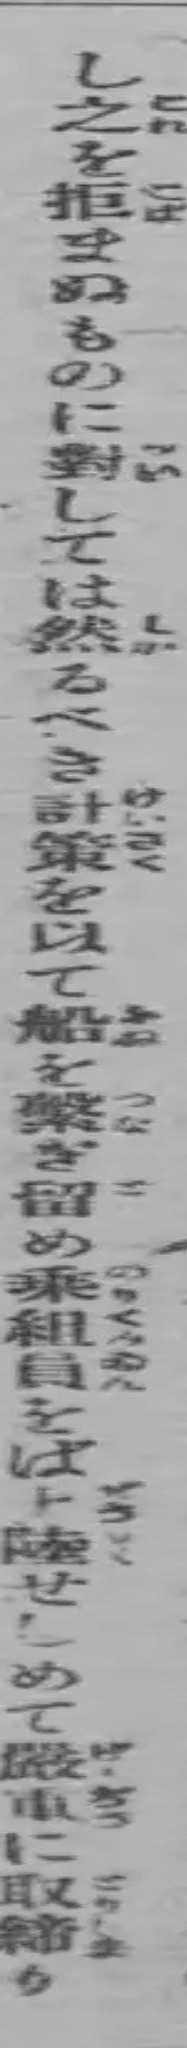し之を拒まぬものに対しては然るべき計策を以て船を繋ぎ留め乗組員をば上陸せしめて厳重に取締り
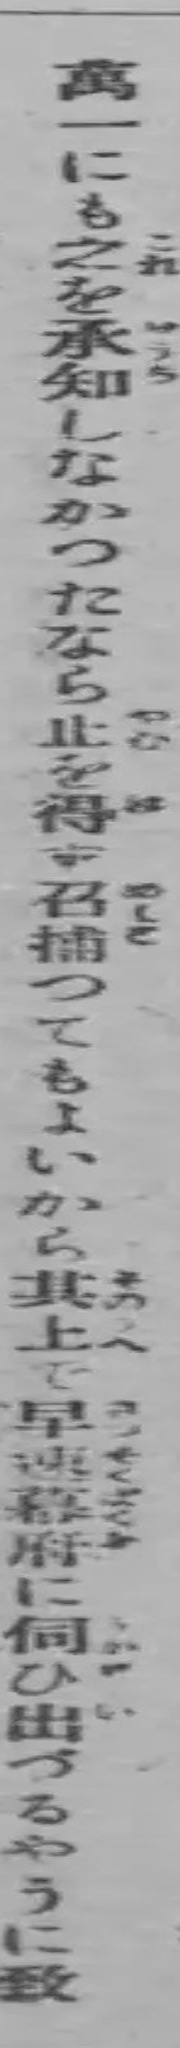万一にも之を承知しなかつたなら止を得ず召捕つてもよいから其上で早速幕府に伺ひ出づるやうに致
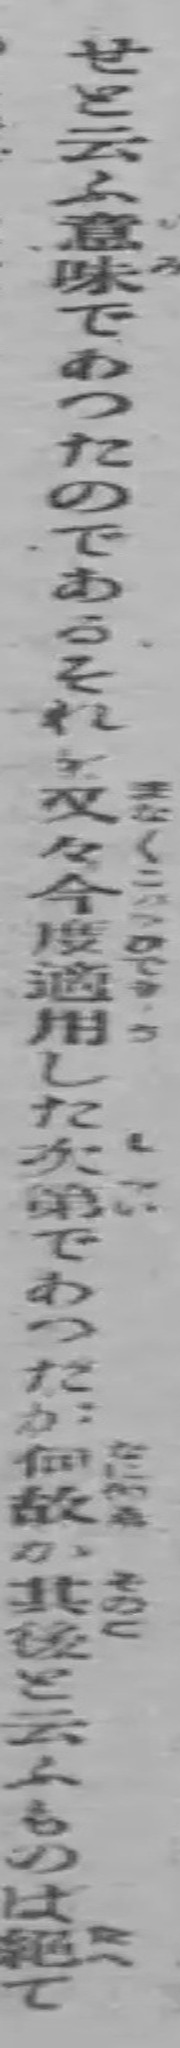せと云ふ意味であつたのであるそれを又々今度適用した次第であつたが何故か其後と云ふものは絶て
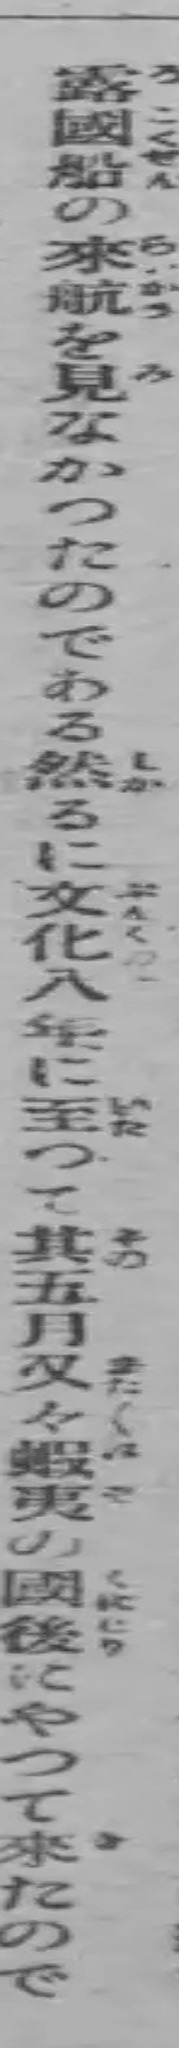露国船の来航を見なかつたのである然るに文化八年に至つて其五月又々蝦夷の国後にやつて来たので
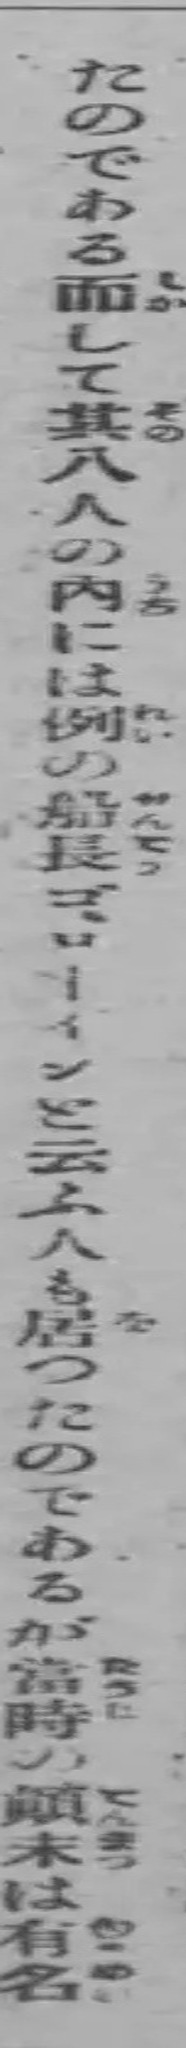たのである而して其八人の内には例の船長ゴ、ローインと云ふ人も居つたのであるが当時の顛末は有名
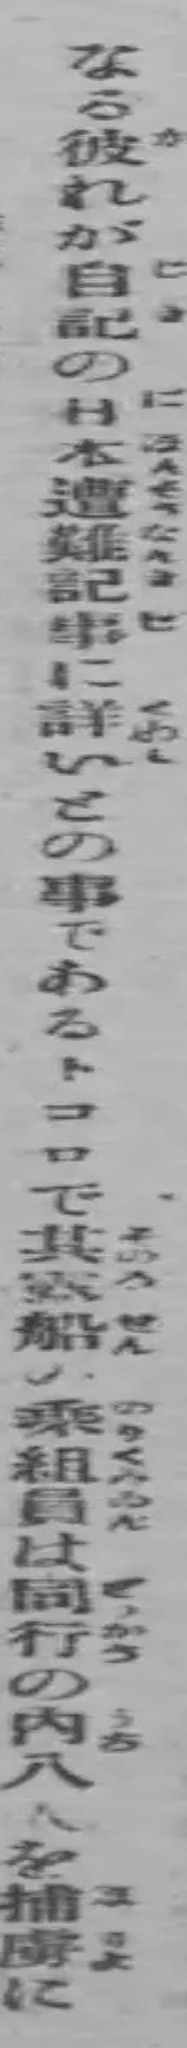なる彼れが自記の日本遭難記事に詳いとの事であるトコロで其露船の乗組員は同行の内八人を捕虜に
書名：豊橋市史談
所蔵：国立国会図書館 National Diet Library, JAPAN
